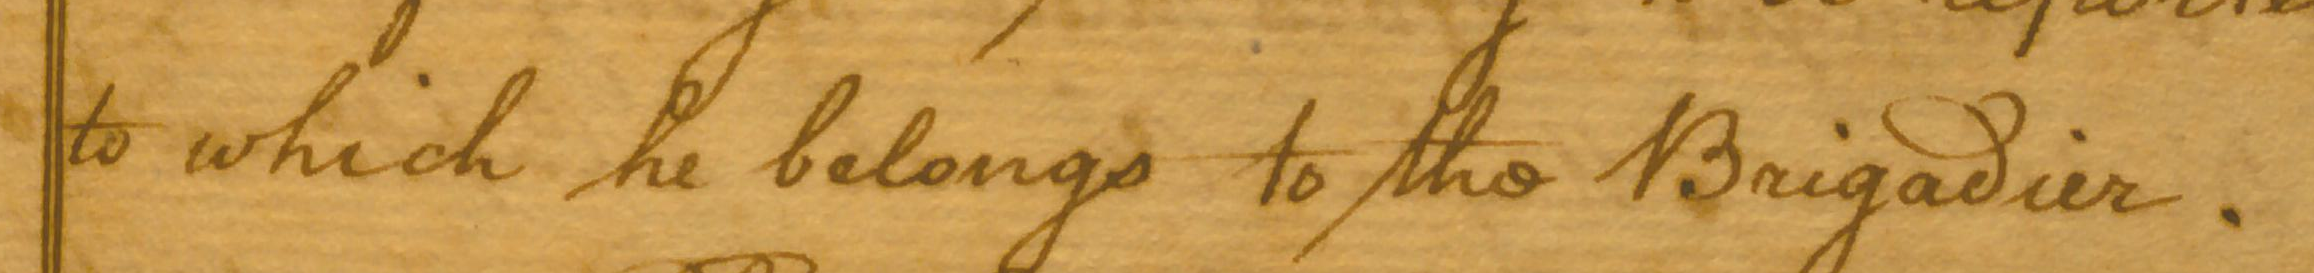to which he belongs to the Brigadier.
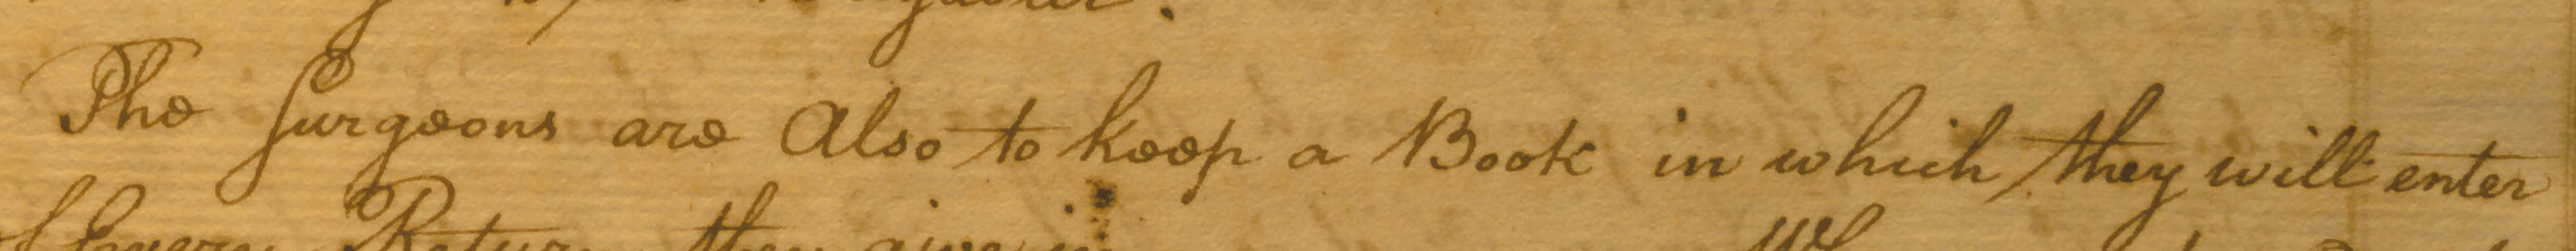The Surgeons are Also to keep a Book in which they will enter
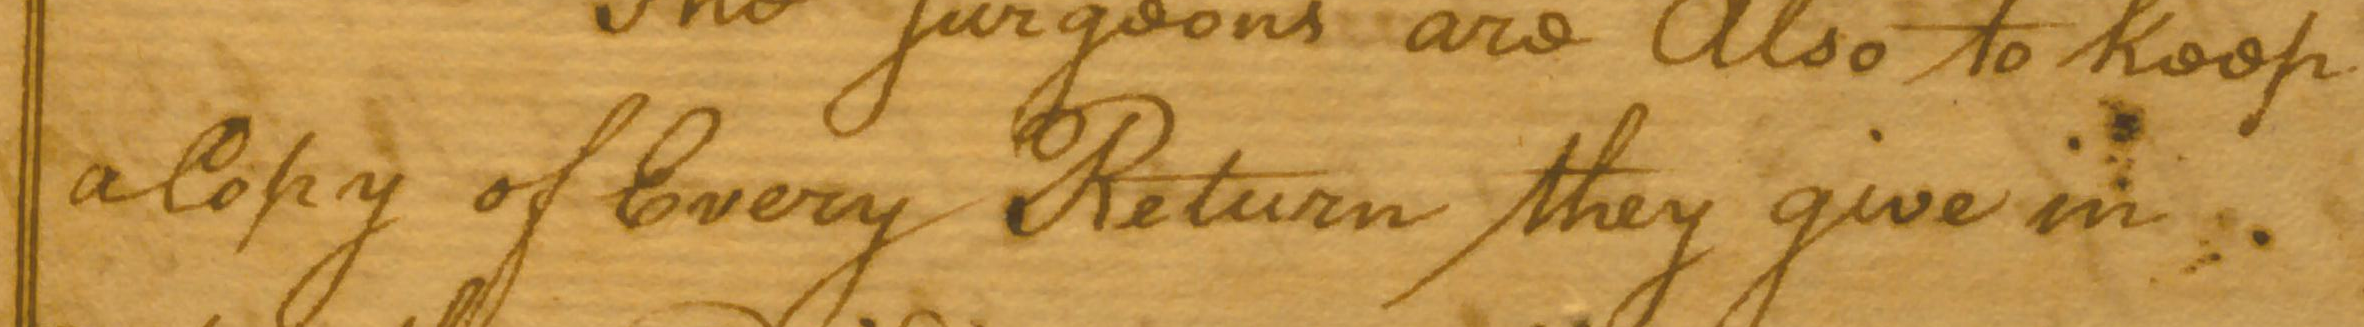a Copy of Every Return they give in.
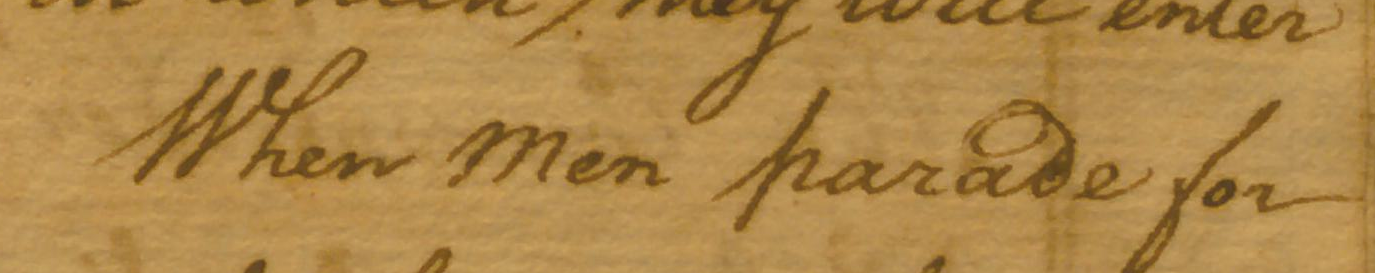When men parade for
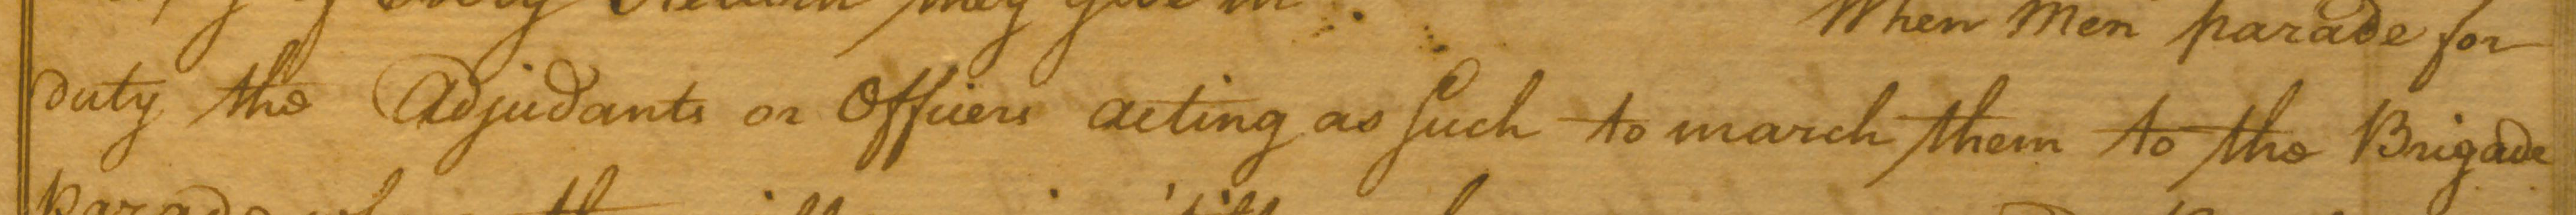duty the Adjudants or Officers acting as Such to march them to the Brigade
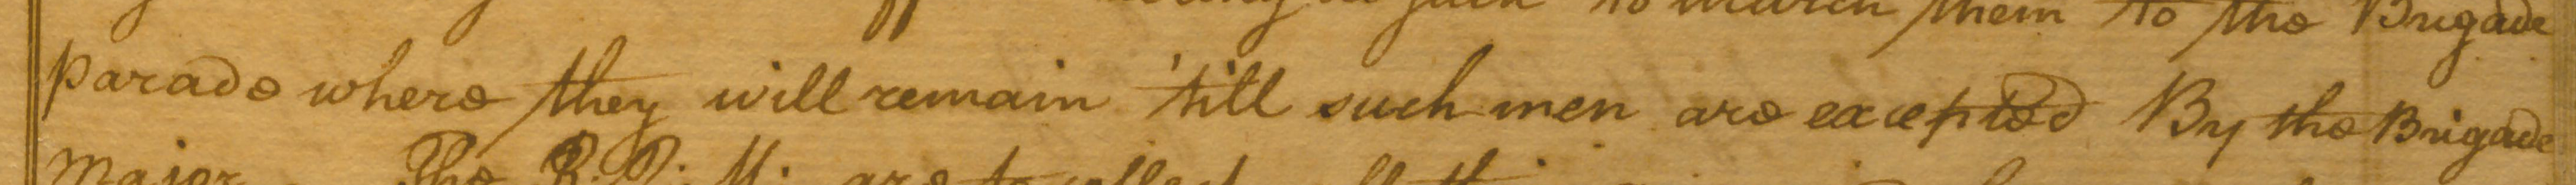parade where they will remain 'till such men are excepted By the Brigade
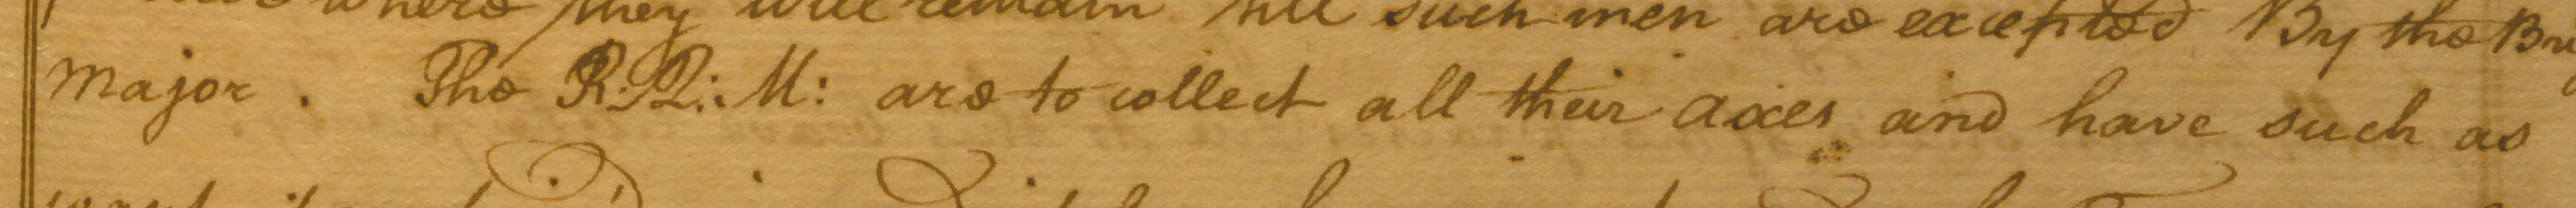Major. The R: Q: M: are to collect all their axes and have such as
